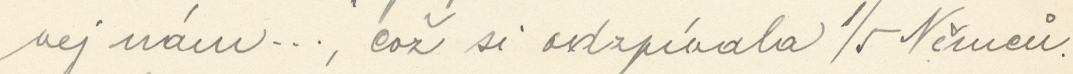vej nám..., což si odzpívala 1/5 Němců.
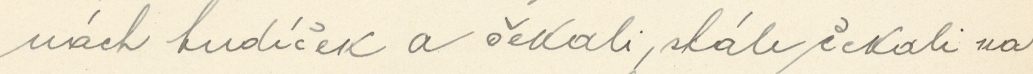nách budíček a čekali, stále čekali na
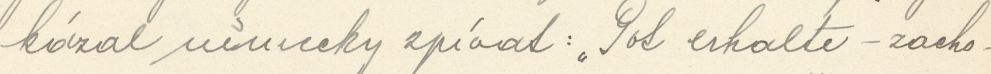kázal německy zpívat: „Pot erhalte - zacho-
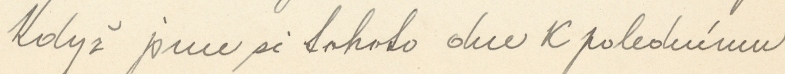Když jsme si tohoto dne k polednímu
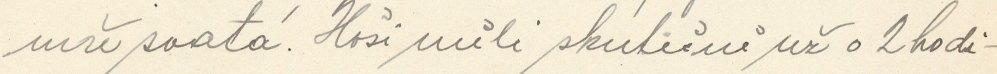mše svatá. Hoši měli skutečně už o 2 hodi-
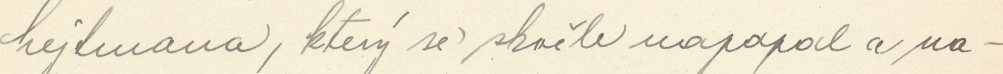hejtmana, který se skvěle napapal a na-
